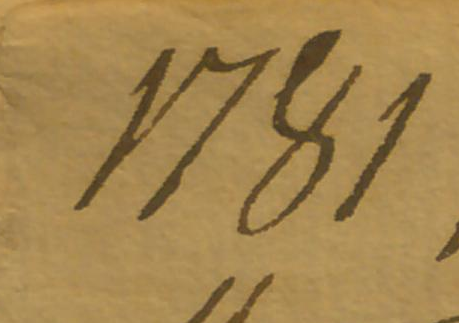1781
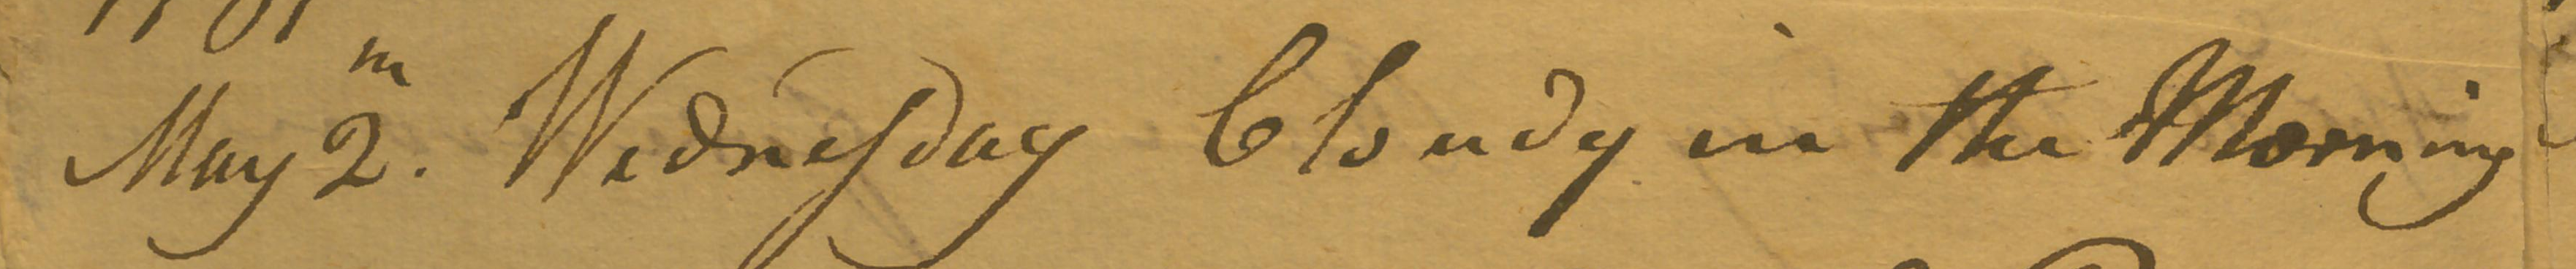May 2^th. Wednesday Cloudy in the Morning
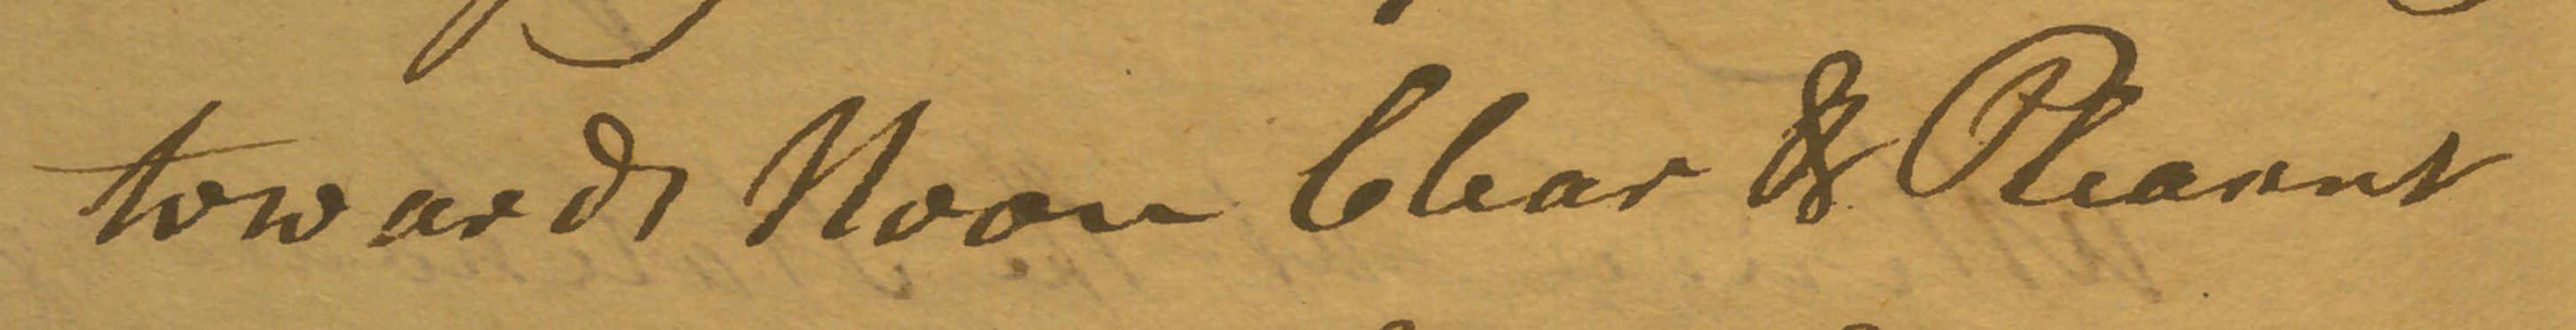towards Noone Clear & Pleasent
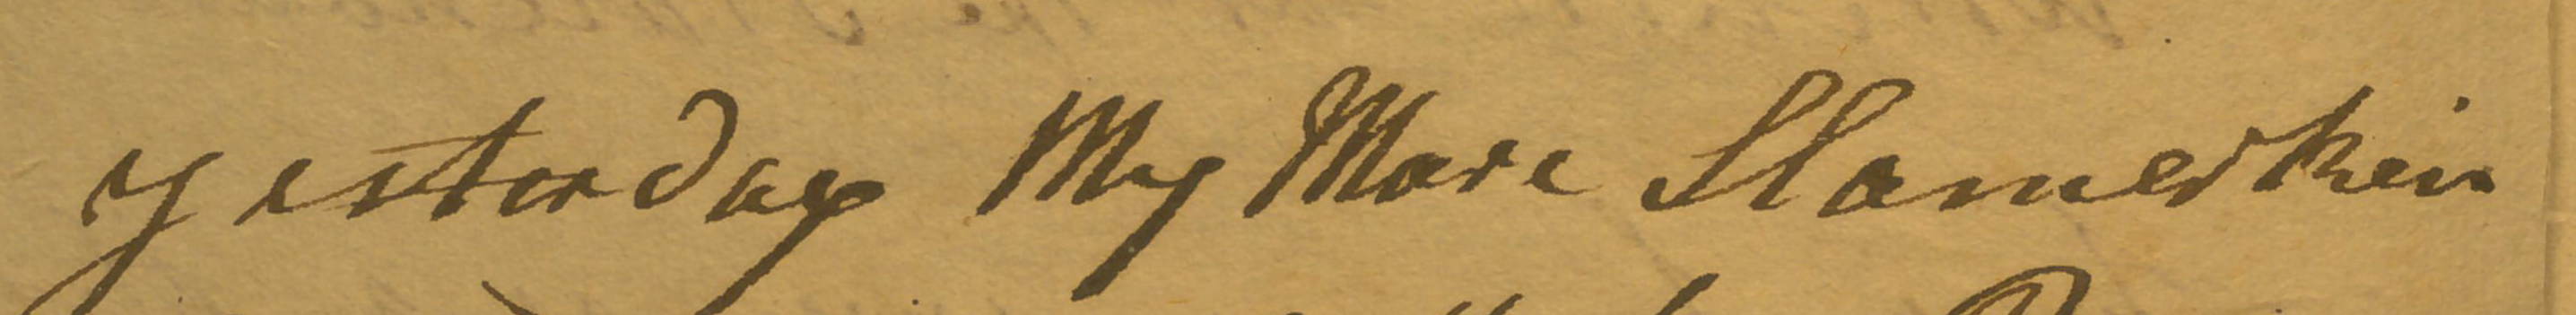yesterday My Mare Slamerkin
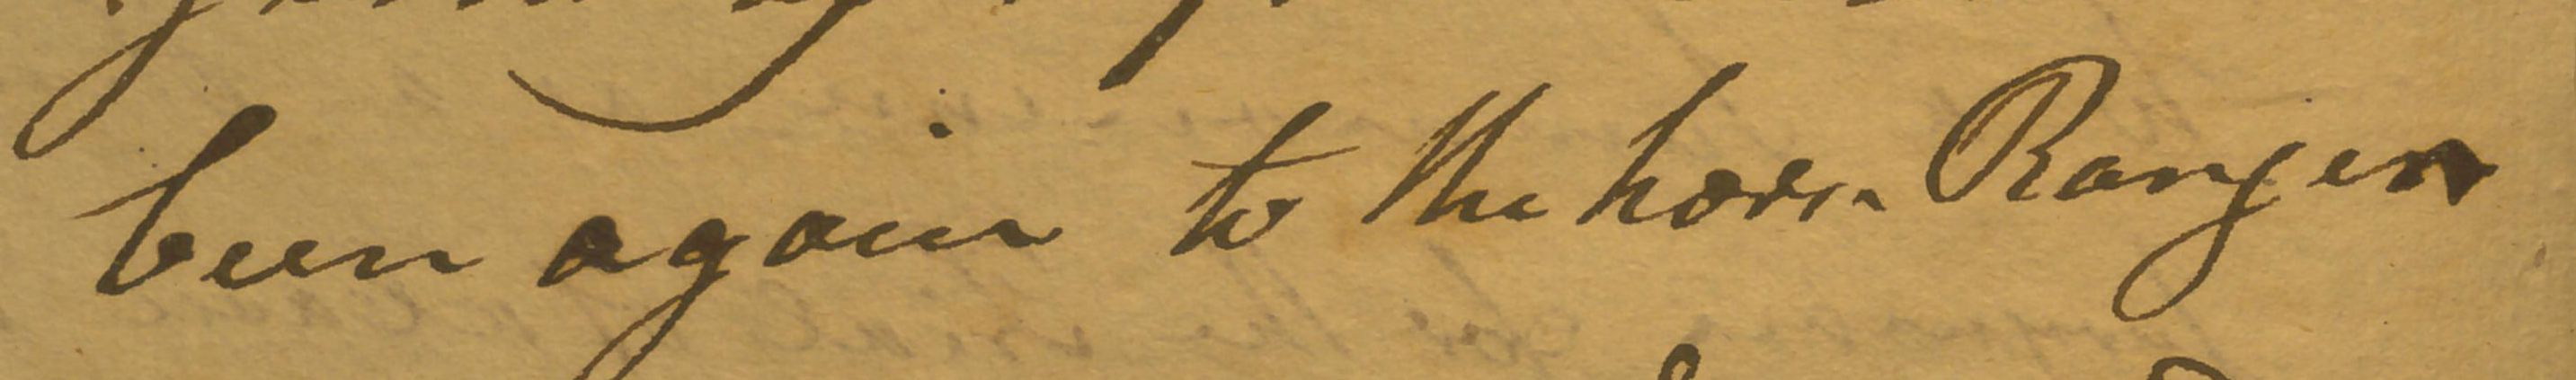been again to the horse Ranger
